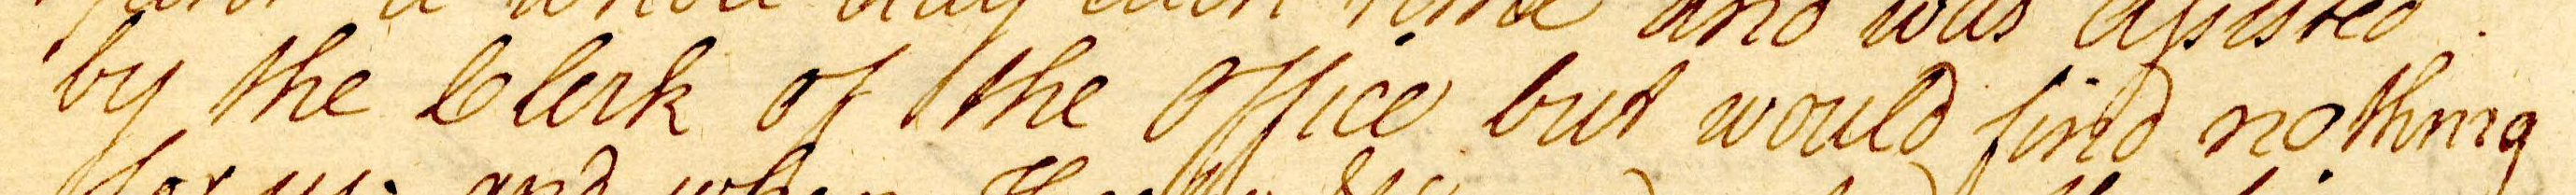by the Clerk of the Office but would find nothing
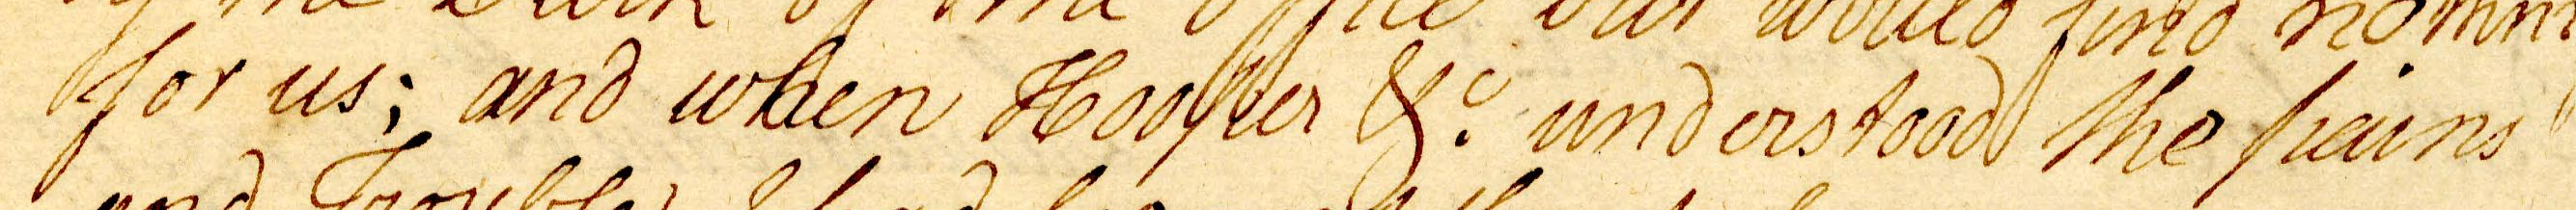for us; and when Hooper &^c. understood the pains
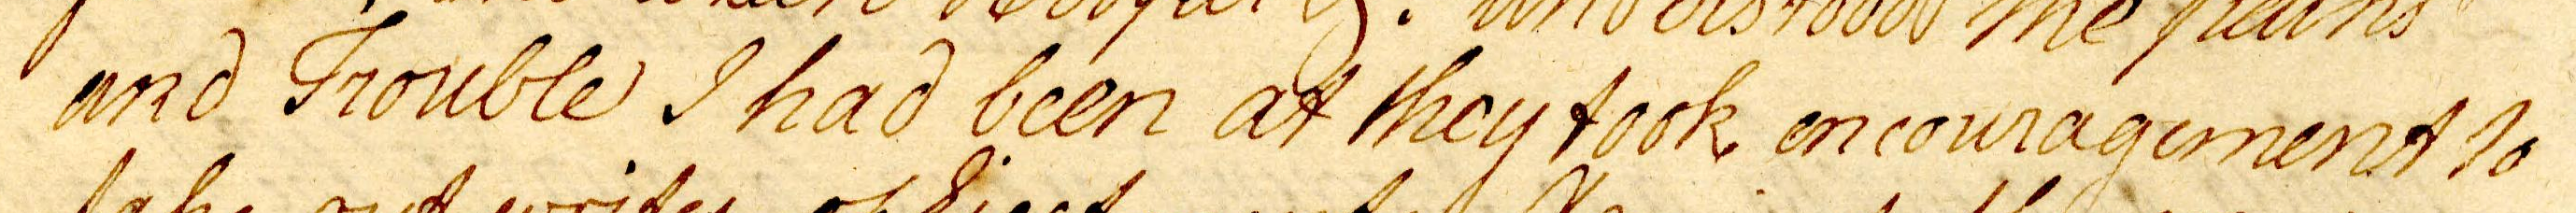and Trouble I had been at they took encouragement to
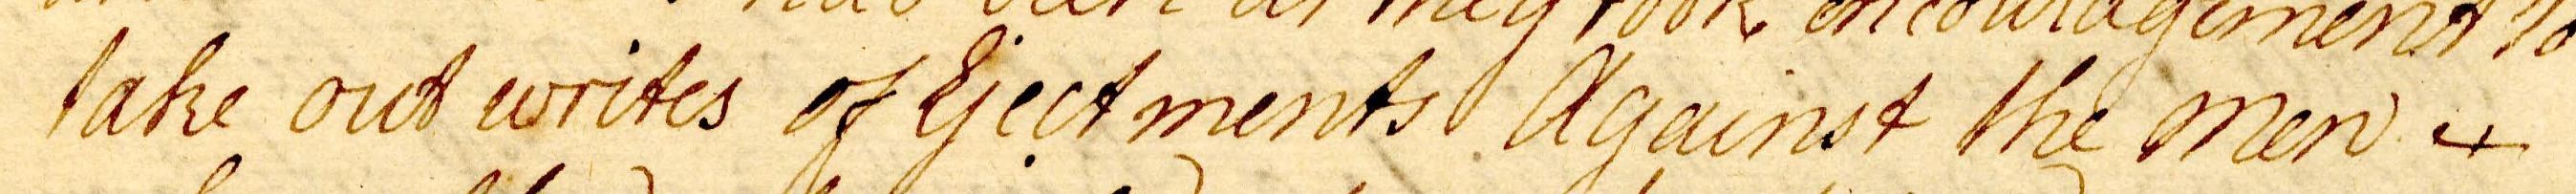take out writes of Ejectments Against the Men-
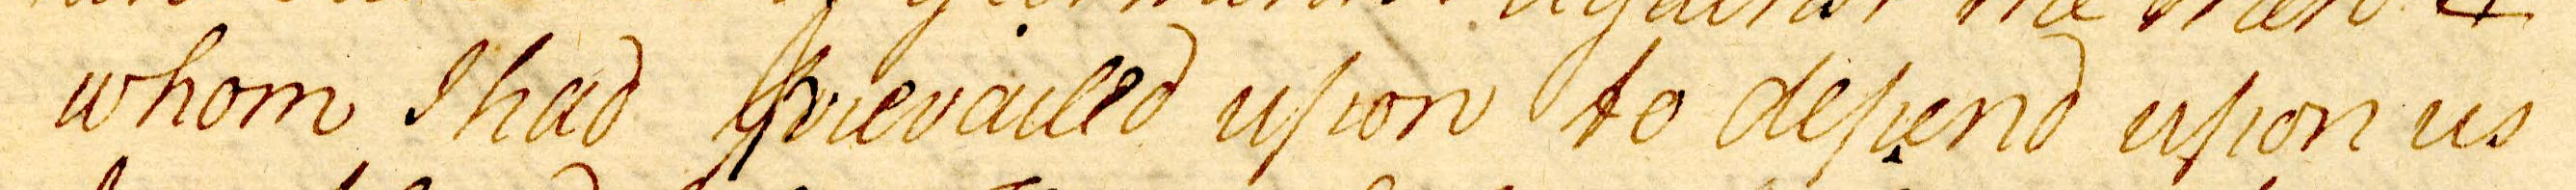whom I had prevailed upon to depend upon us
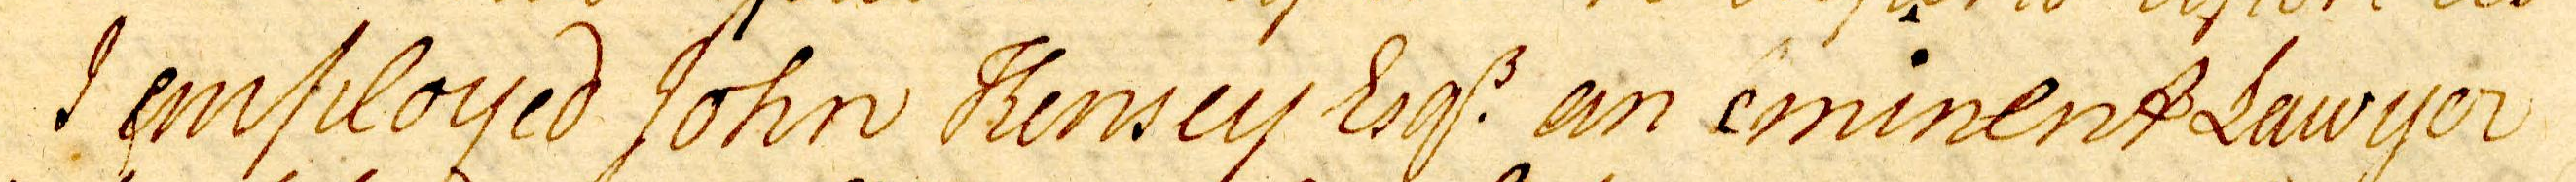I employed John Kensey Esq^r. an eminent Lawyer
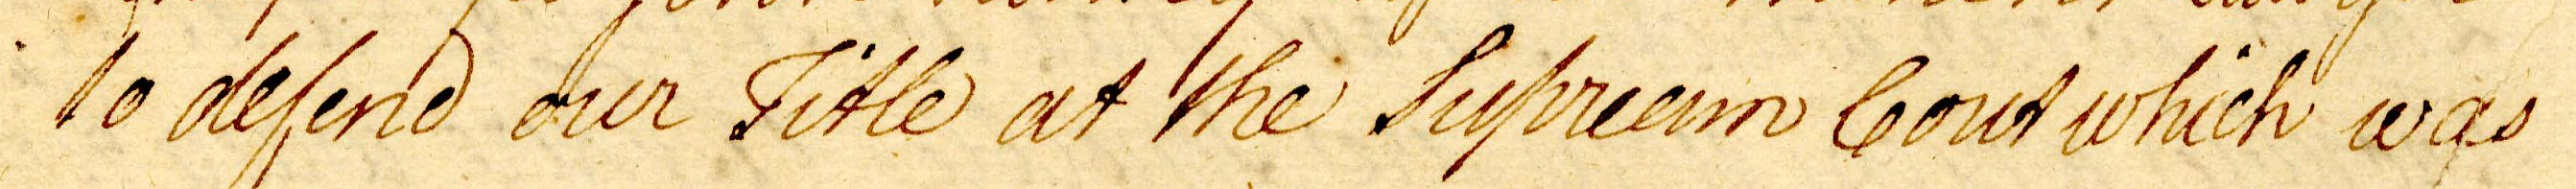to defend our Title at the Supream Cout which was
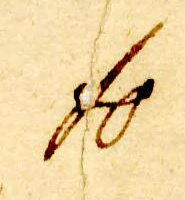to
